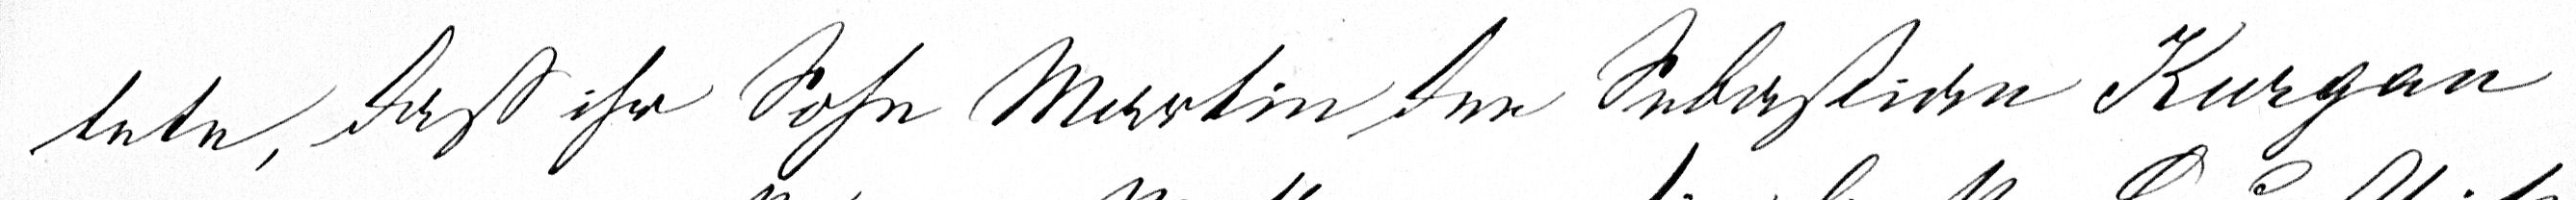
tete, daß ihr Sohn Martin den Sebastian Kurgan
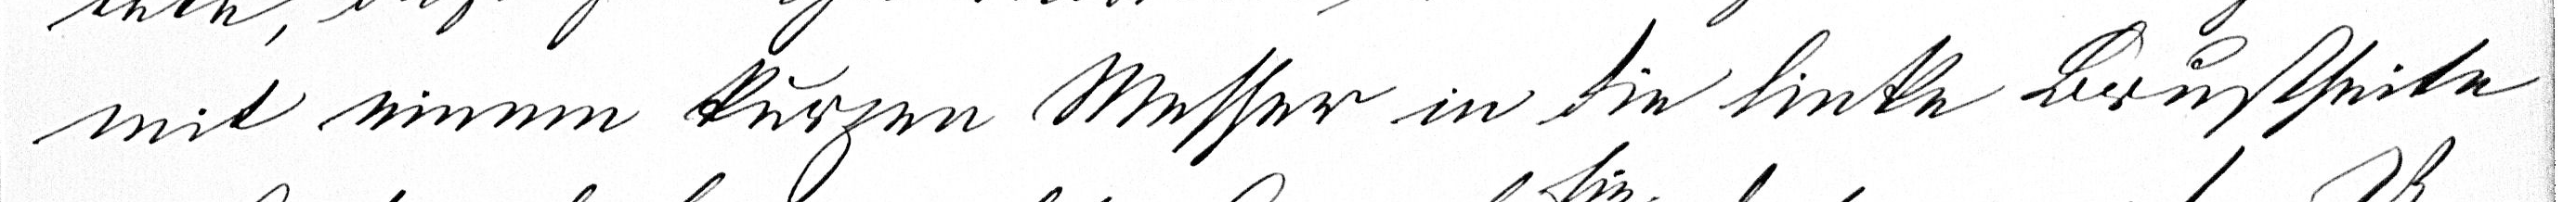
mit einem kurzen Messer in die linke Brustseite
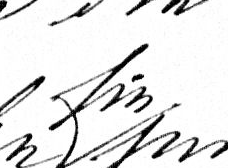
sie
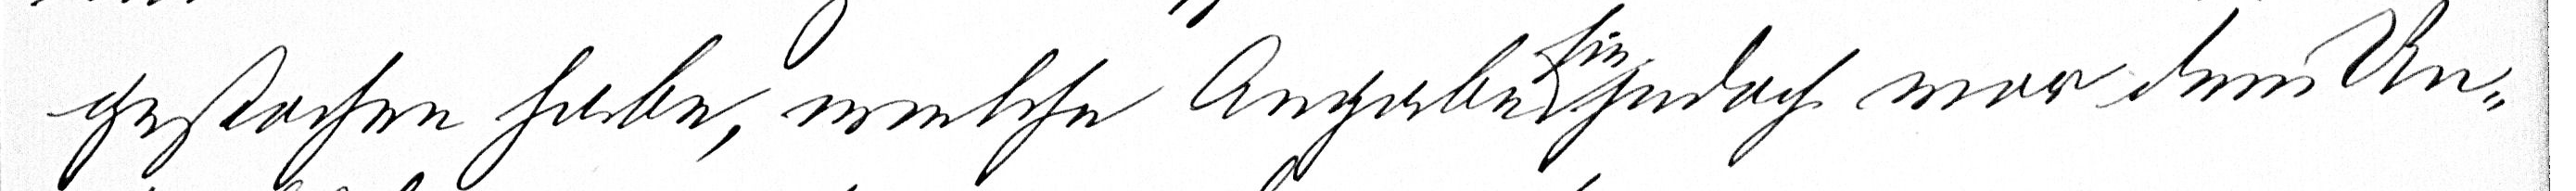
gestochen habe, welche Angabe jedoch vor dem Un¬
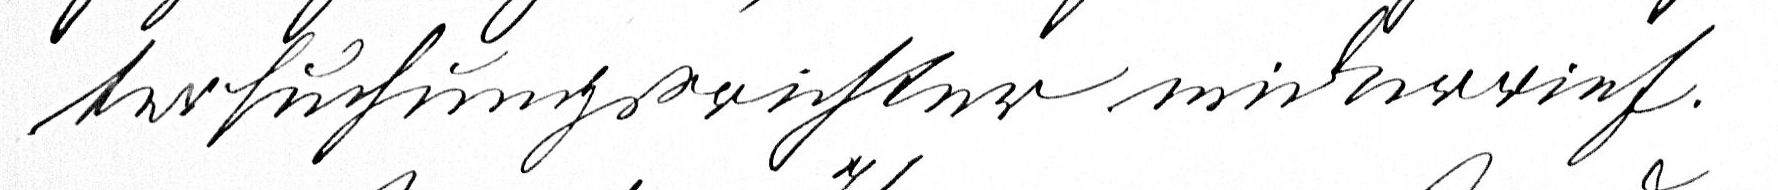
tersuchungsrichter widerrief.
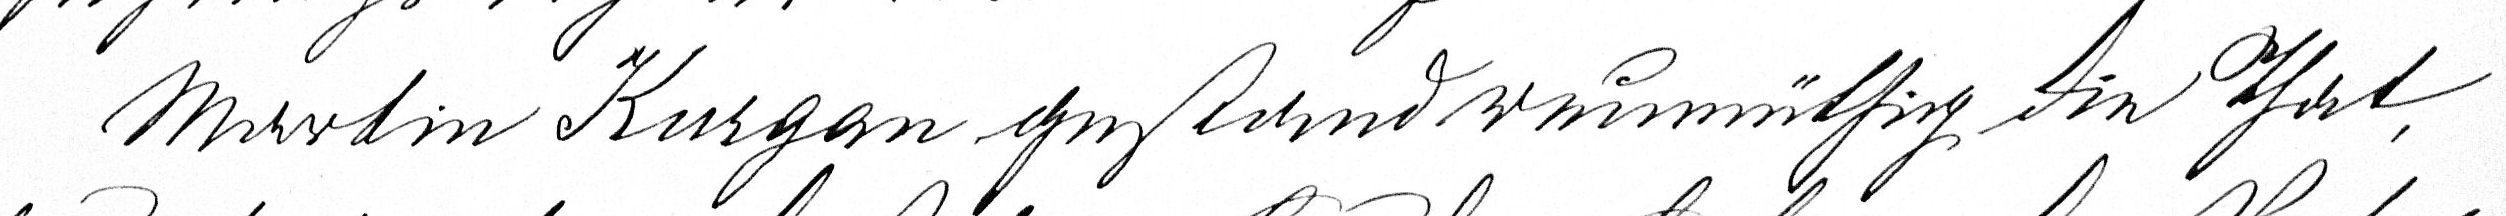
Martin Kurgan gestand reumüthig die That,
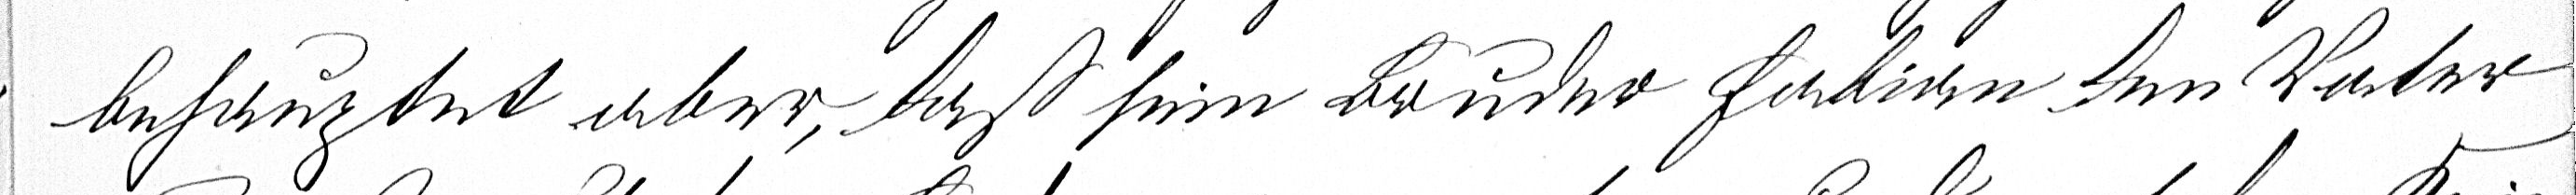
behauptet aber, daß sein Bruder Fabian den Vater
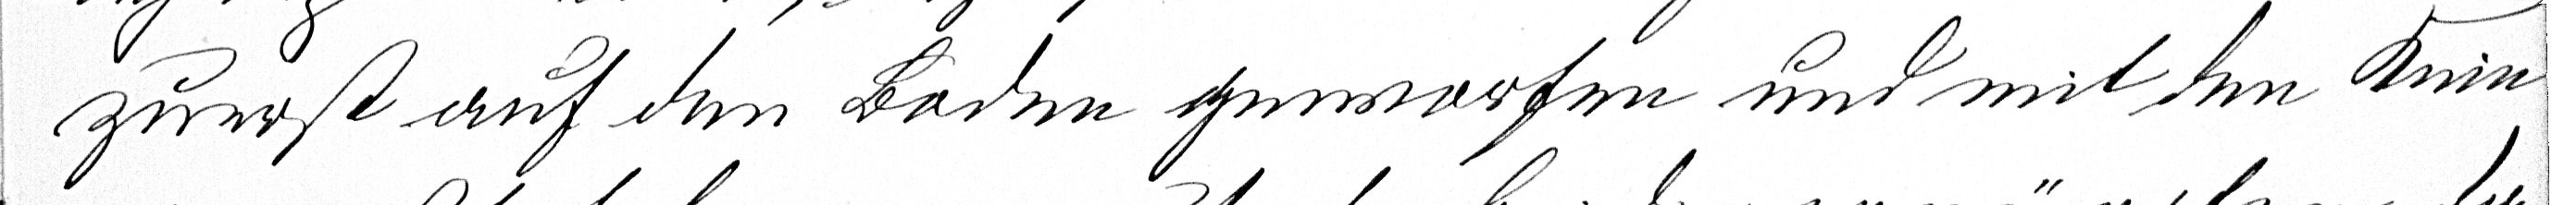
zuerst auf den Boden geworfen und mit den Kein
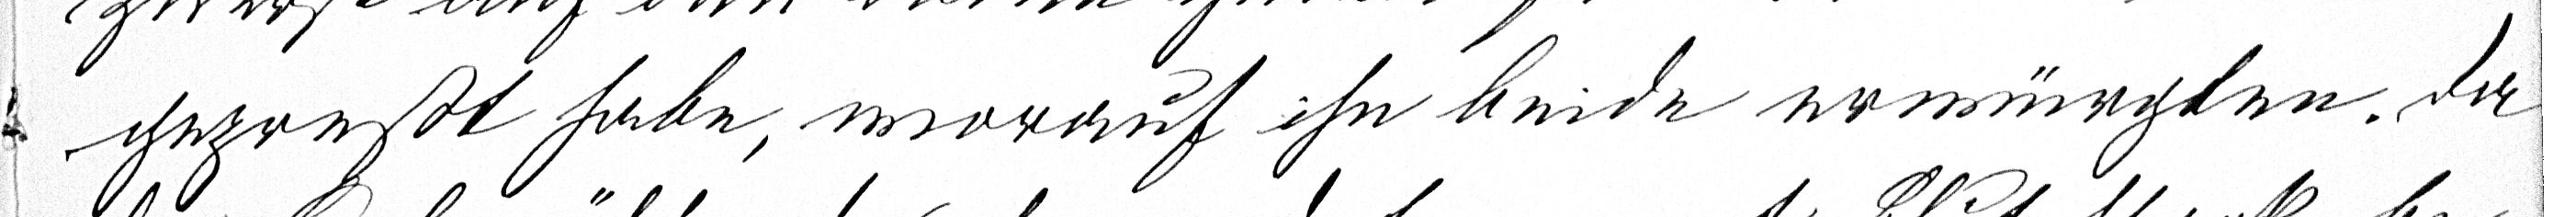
gepreßt habe, worauf ihn beide erwürgten, da
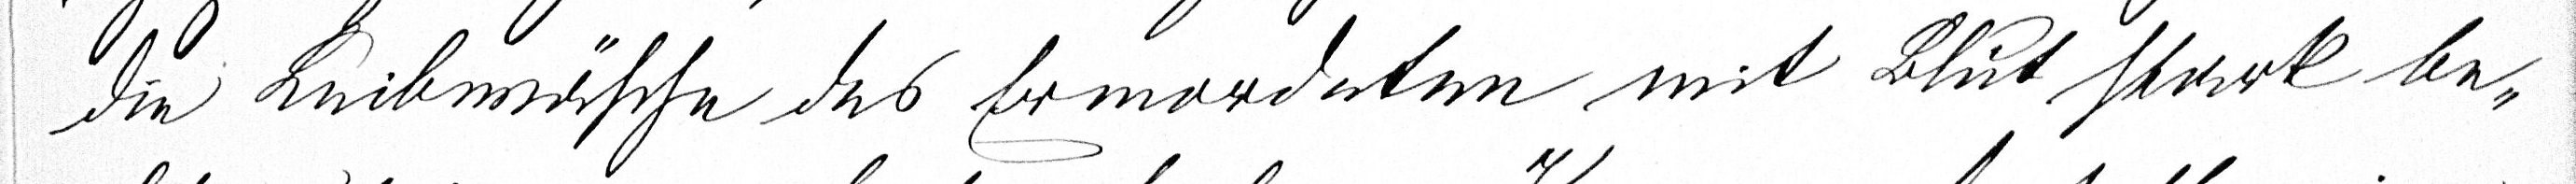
die Leibwäsche des Ermordeten mit Blut stark be¬
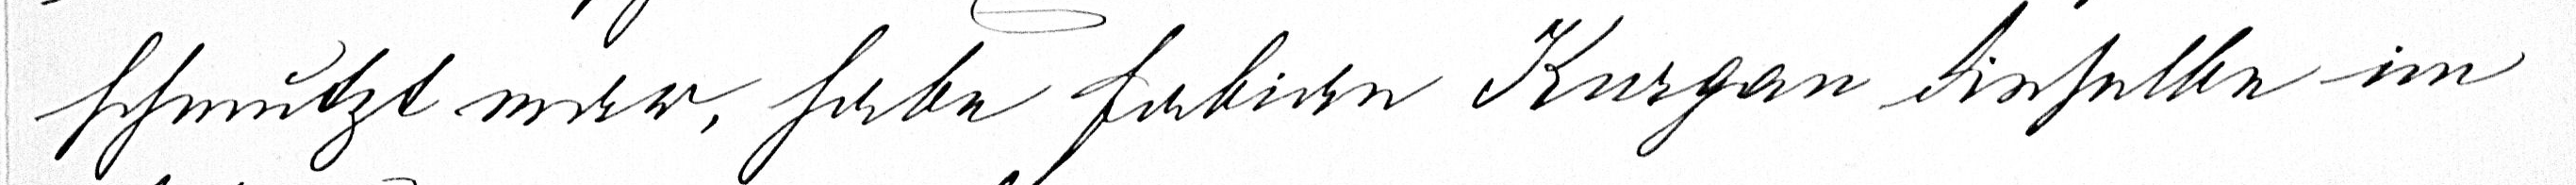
schmutzt vor, habe Fabian Kurgan dieselbe im
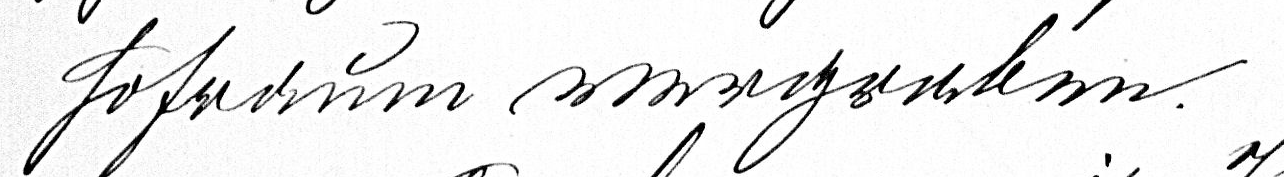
Hofraum vergraben.
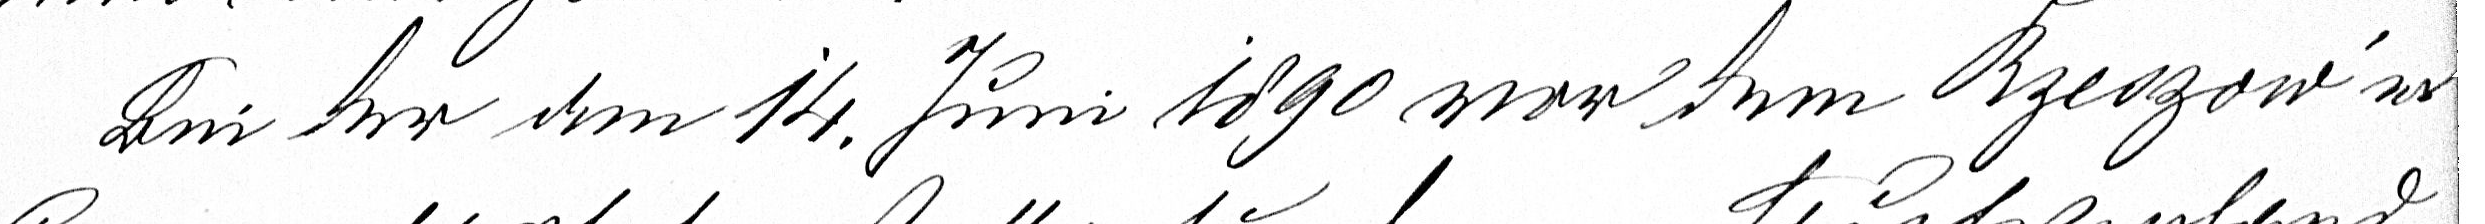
Bin der am 14. Juni 1890 vor dem Kzeszów er
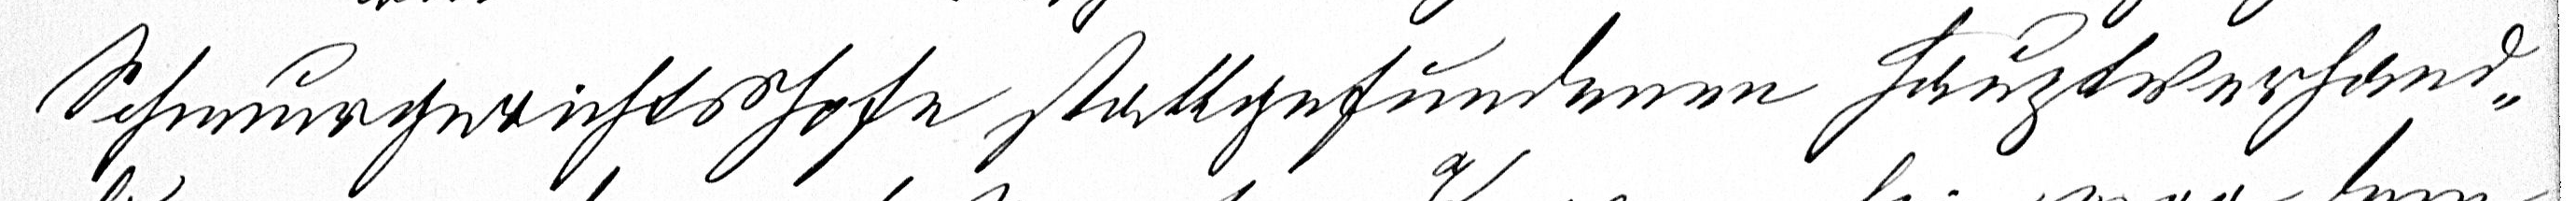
Schwurgerichtshofe stattgefundenen Hauptverhand¬
